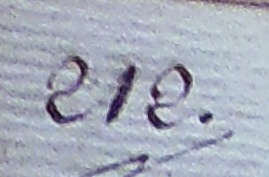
212.
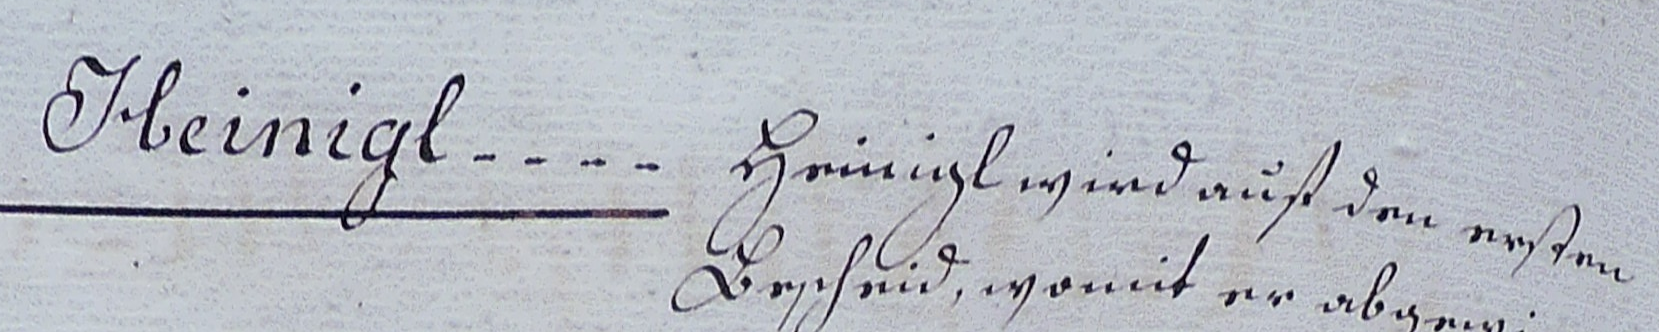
Heinigl .. .. .. .. Heinigl wird auf den ersten
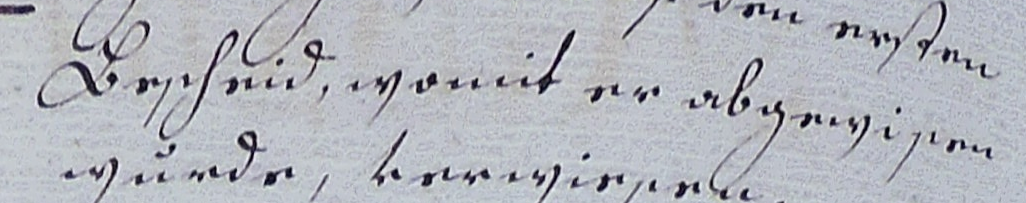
Bescheid, womit er abgewisen
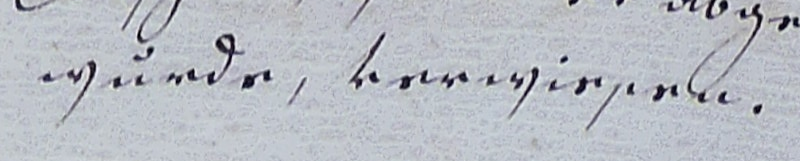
wurde, verwiesen.
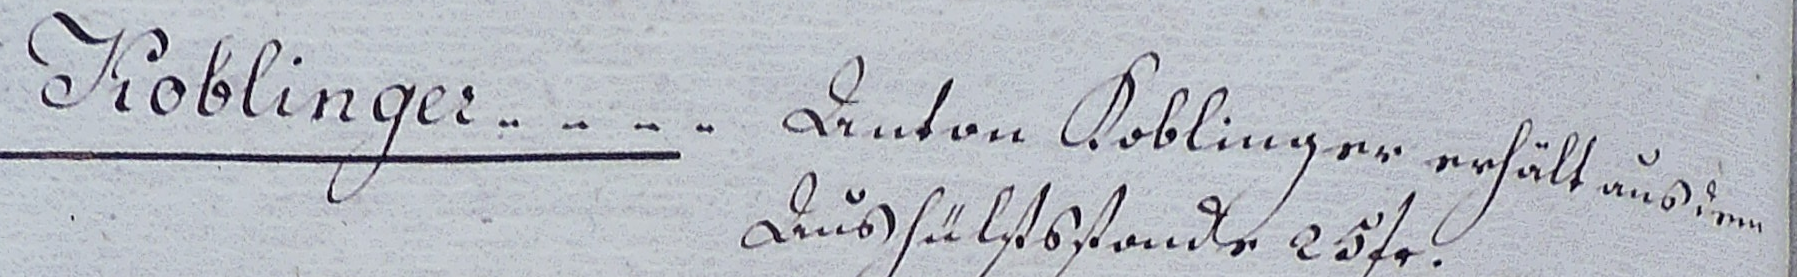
Koblinger .. .. .. .. Anton Koblinger erhält aus dem
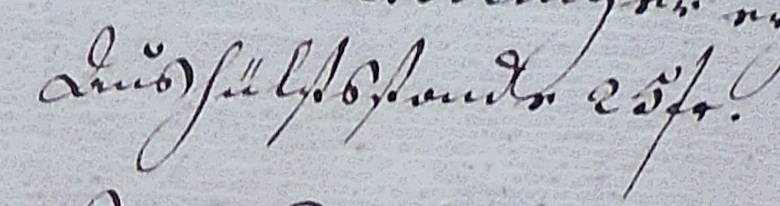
Aushülfsfonde 25fr.
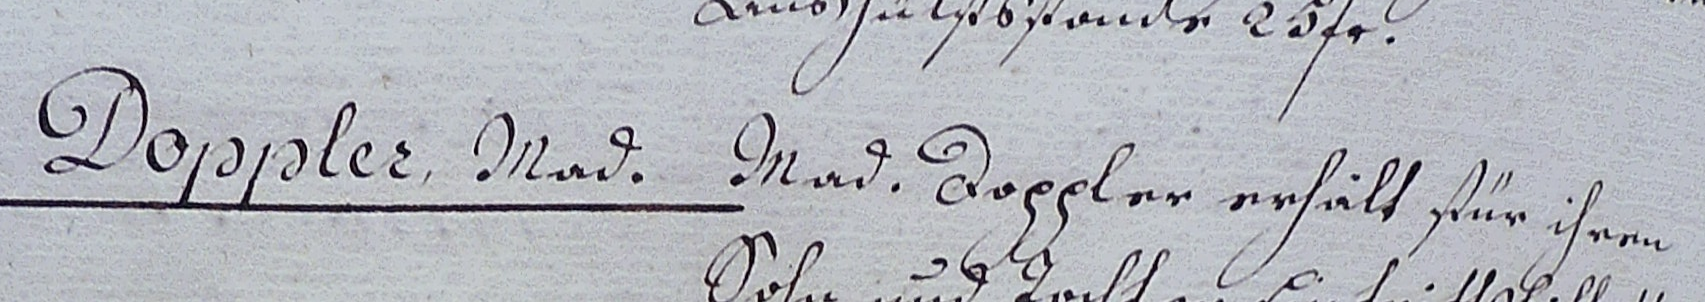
Doppler, Mad. Mad Doppler erhält für ihren
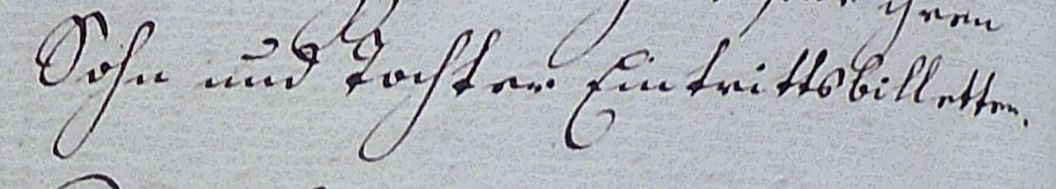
Sohn und Tochter Eintrittsbillette.
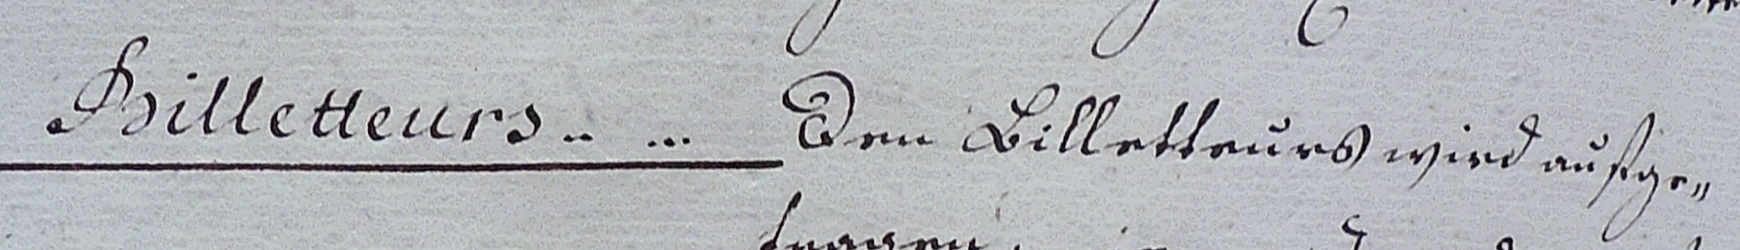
Billetteurs .. ... Den Billetteurs wird aufge¬
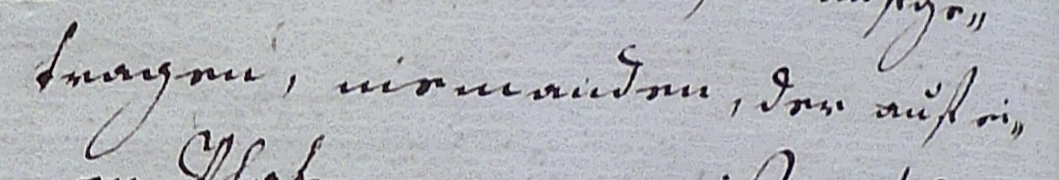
tragen, niemanden, der auf ei¬
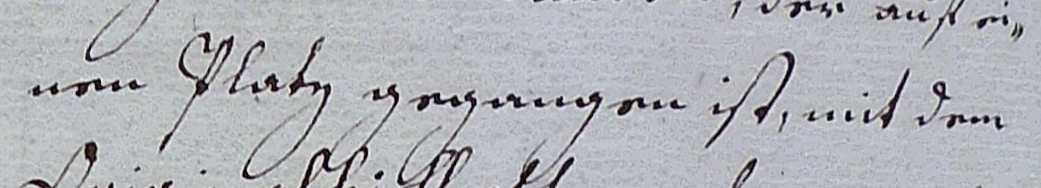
nen Platz gegangen ist, mit dem
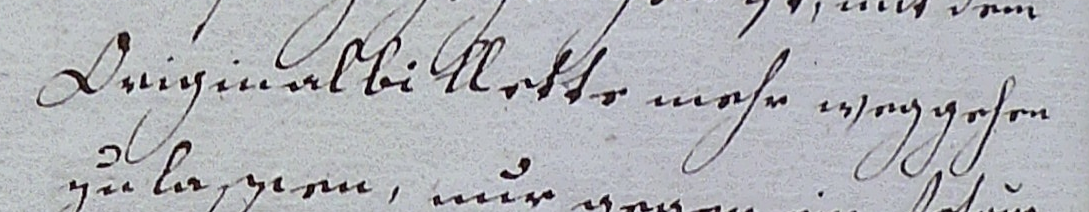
Originalbillette mehr weggehen
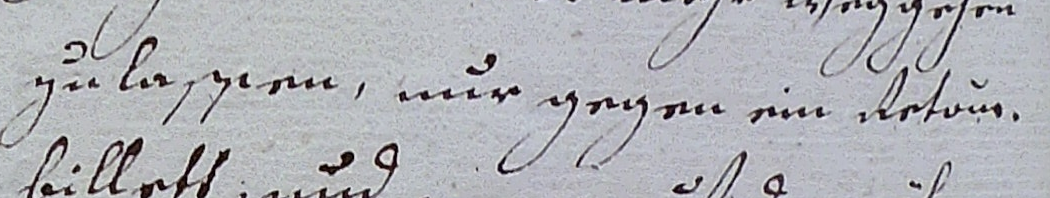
zulassen, nur gegen ein Retour¬
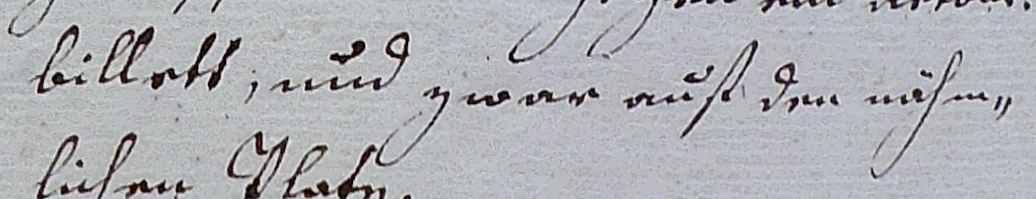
billett, und zwar auf den nähm¬
